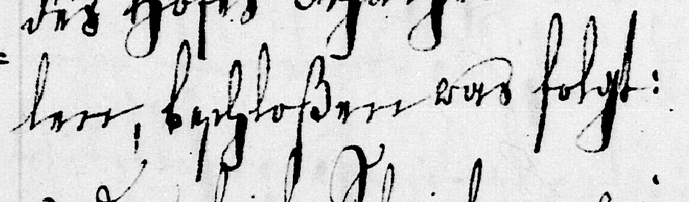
dlen, beschloßen was folgt:
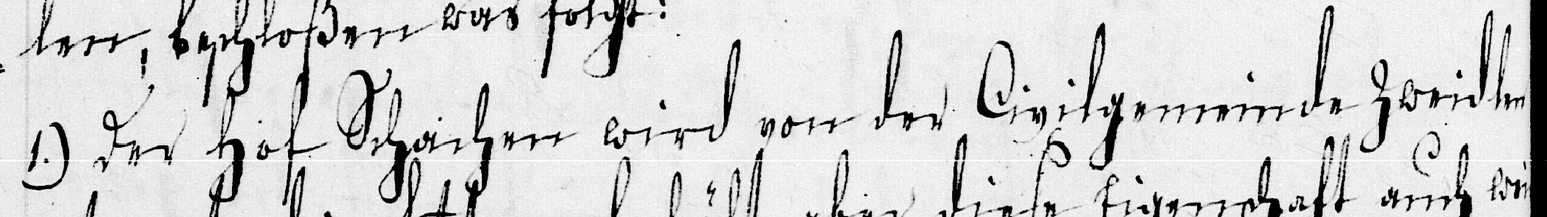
1.) Der Hof Schachen wird von der Civilgemeinde Zweidlen
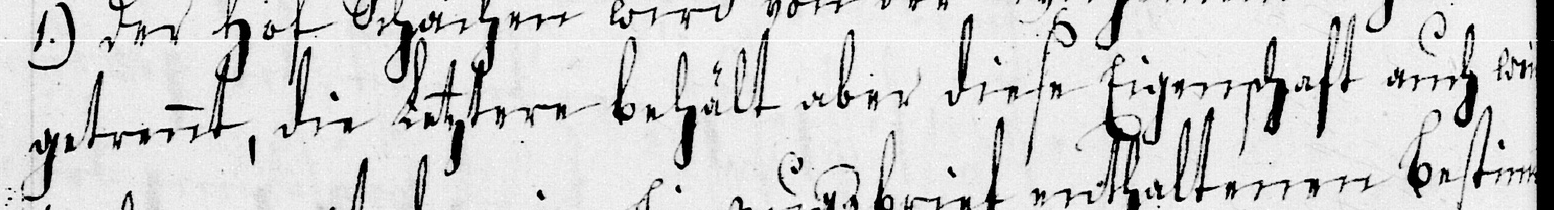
getrennt, die Letztere behält aber diese Eigenschaft auch we¬
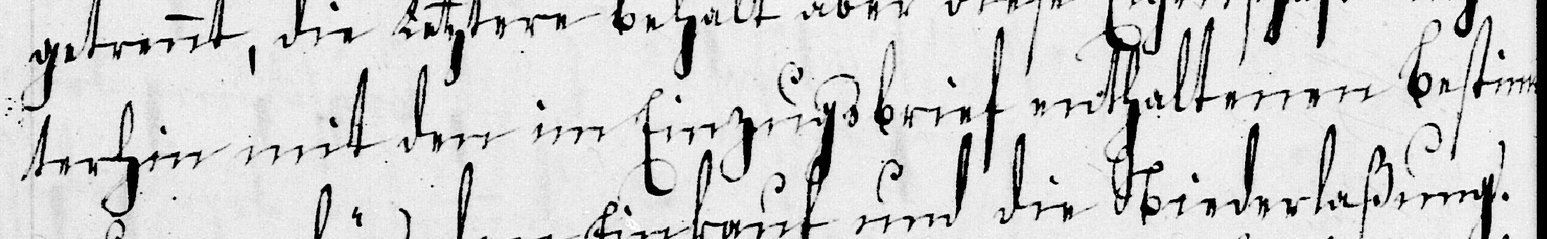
iterhin mit den im Einzugsbrief enthaltenen Bestim¬
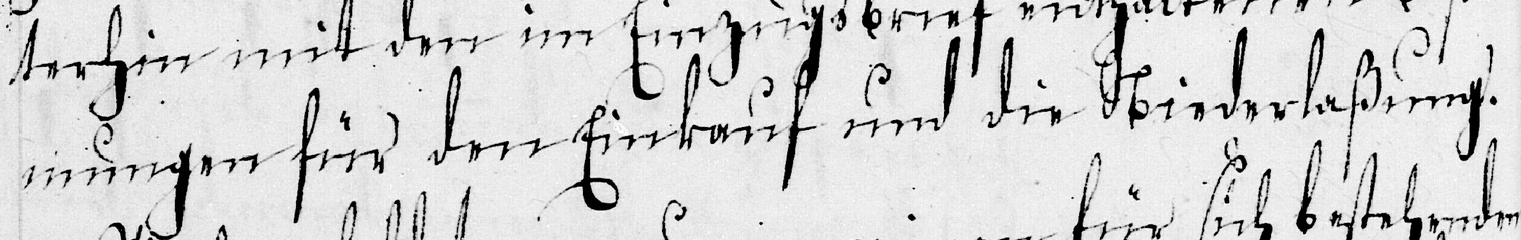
mungen für den Einkauf und die Niederlaßung.
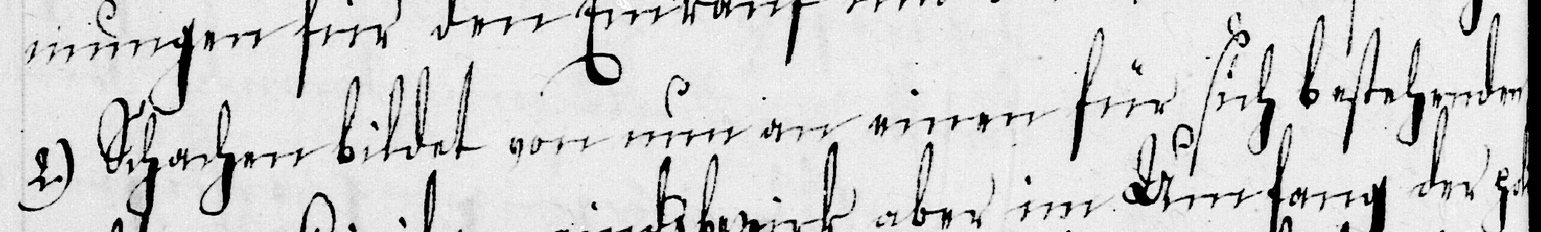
2.) Schachen bildet von nun an einen für sich bestehenden
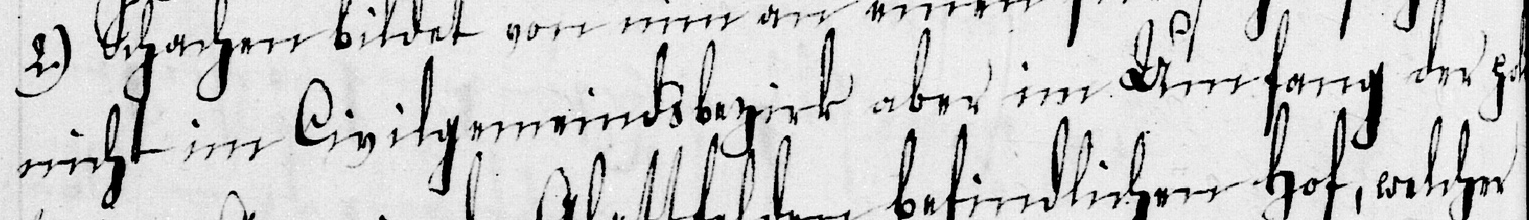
nicht im Civilgemeindsbezirk aber im Umfang der
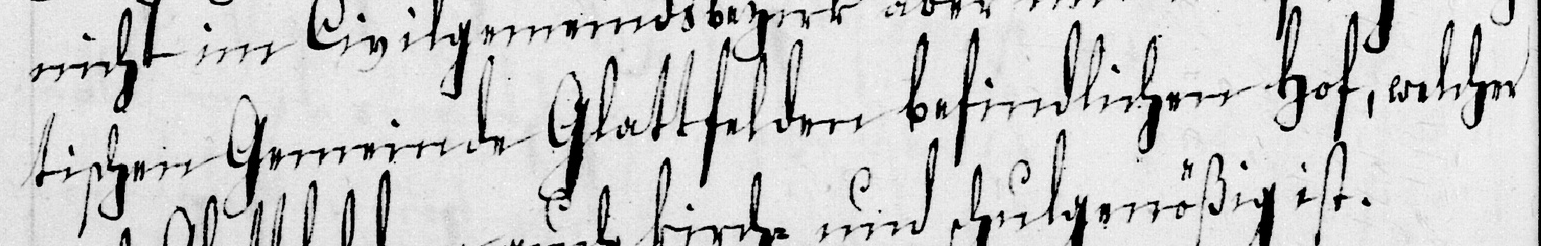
tischen Gemeinde Glattfelden befindlichen Hof, welcher
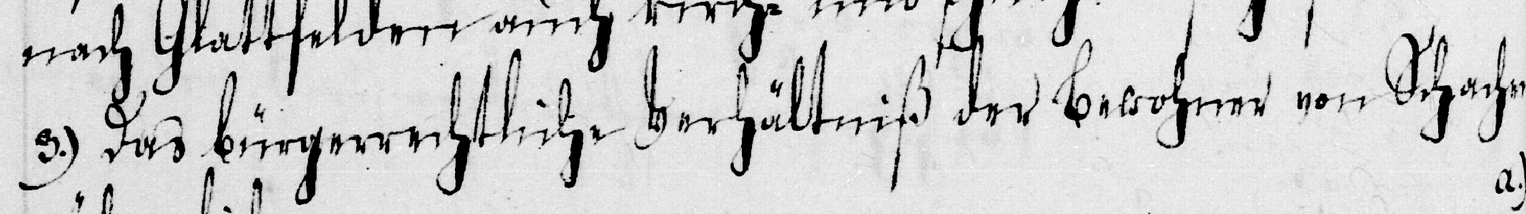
3.) Das bürgerrechtliche Verhältniß der Bewohner von Schac¬
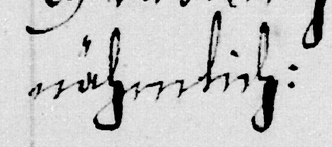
nähmlich:
